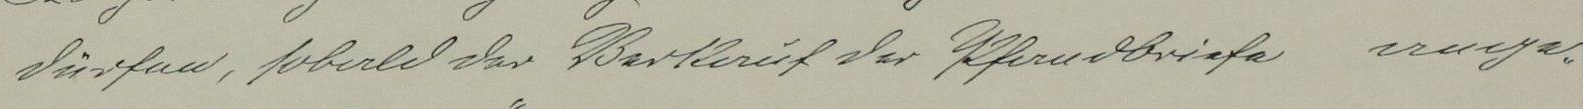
dürfen, sobald der Verkauf der Pfandbriefe ange-
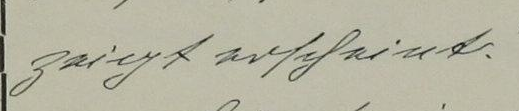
zeigt erscheint.“
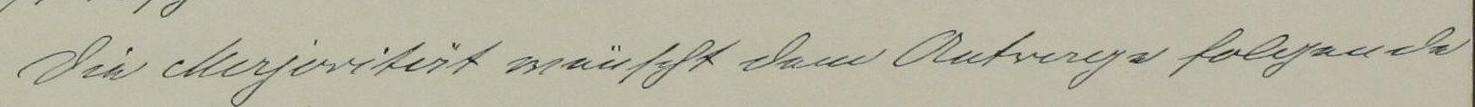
Die Majorität wünscht dem Antrage folgende
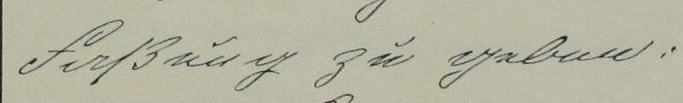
Faßung zu geben:
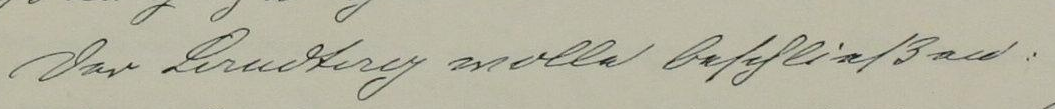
Der Landtag wolle beschließen:
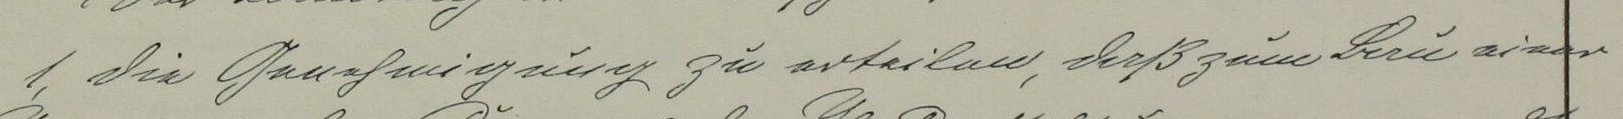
1. die Genehmigung zu erteilen, daß zum Bau einer
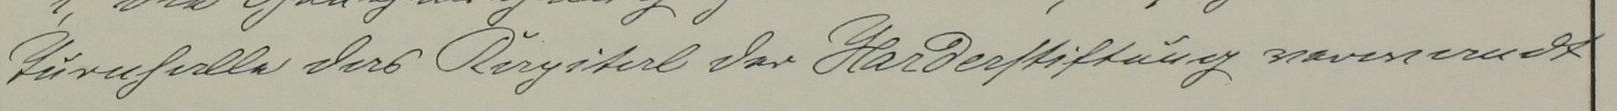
Turnhalle das Kapital der Harderstiftung verwandt
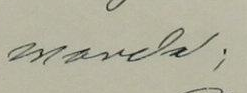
werde;
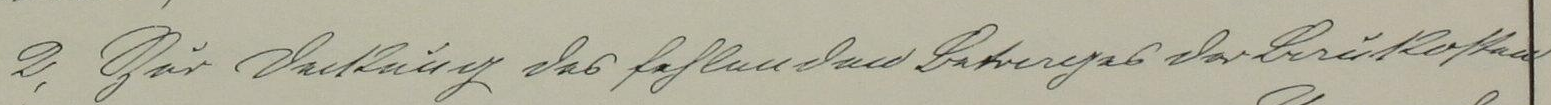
2. Zur Deckung des fehlenden Betrages der Baukosten
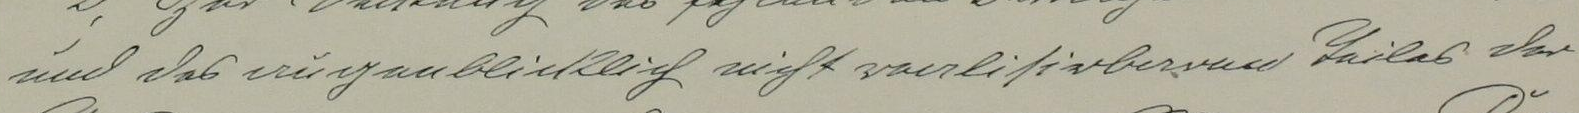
und des augenblicklich nicht realisierbaren Teiles der
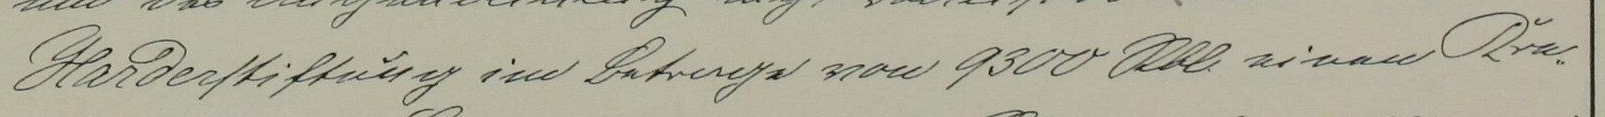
Harderstiftung im Betrage von 9300 Rbl. einen Kre-
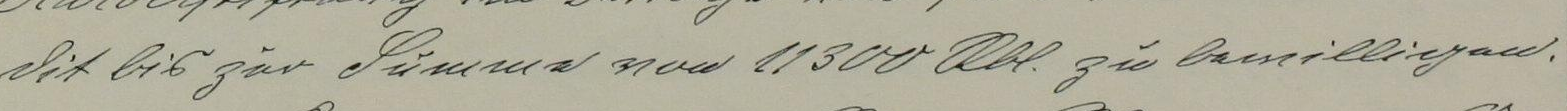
dit bis zur Summe von 11300 Rbl. zu bewilligen.
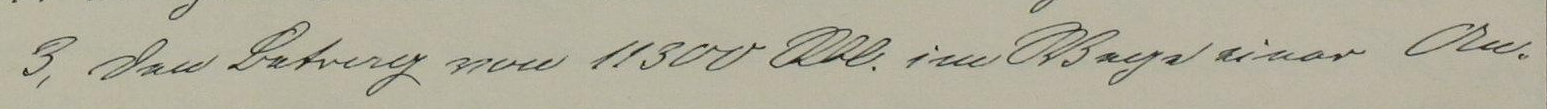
3. Den Betrag von 11300 Rbl. im Wege einer An-
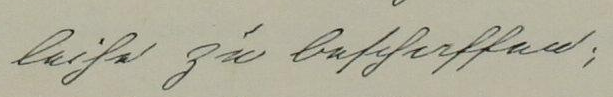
leihe zu beschaffen;
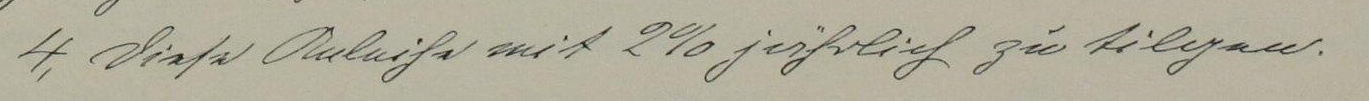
4. Diese Anleihe mit 2% jährlich zu tilgen.
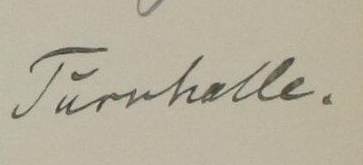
Turnhalle.
